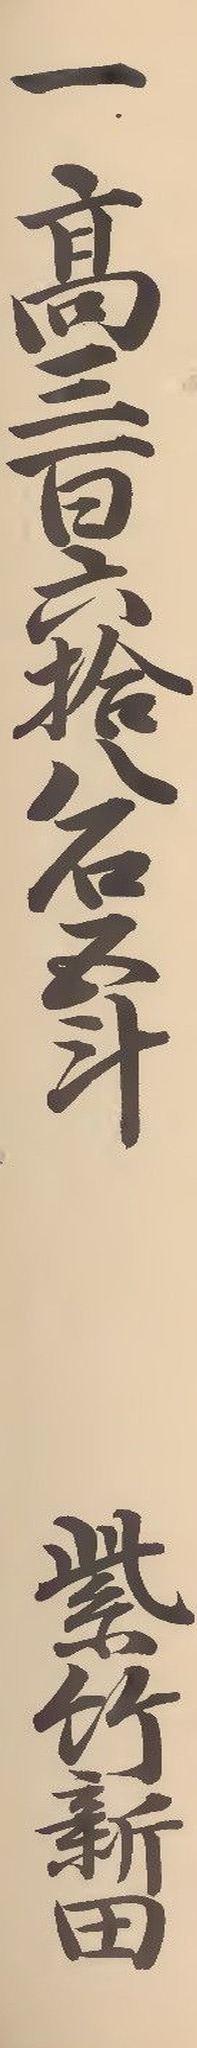一高三百六拾八石五斗紫竹新田
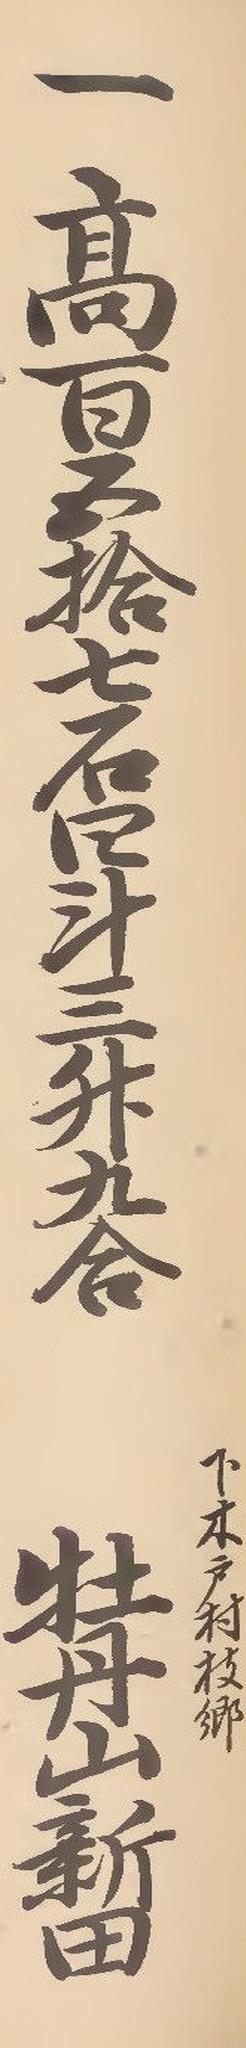一高百五拾七石四斗三升九合牡丹山新田
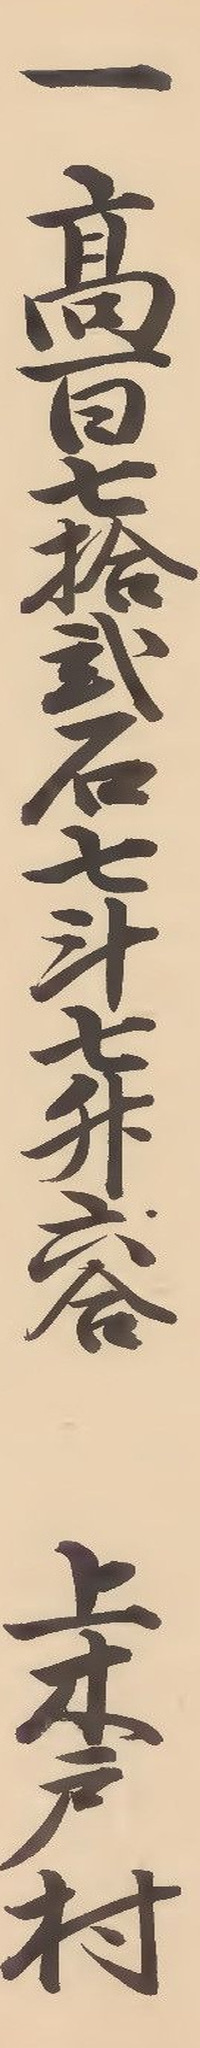一高百七拾弐石七斗七升六合上木戸村
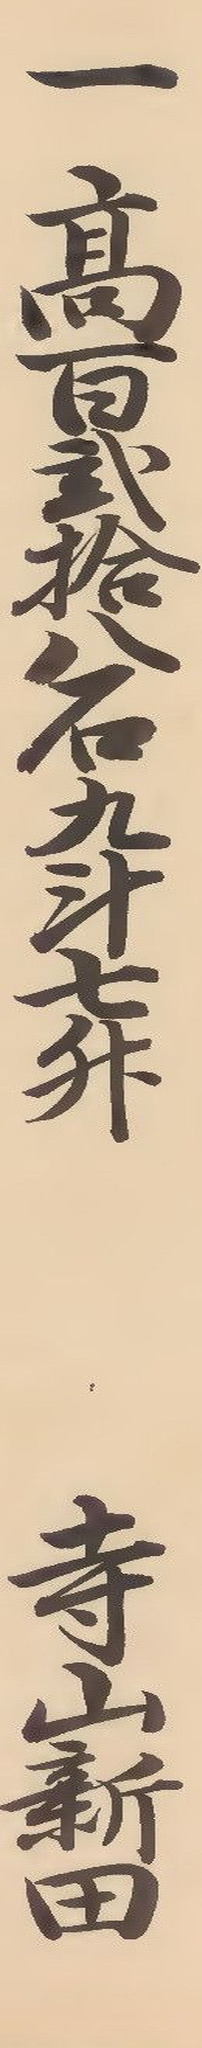一高百弐拾八石九斗七升寺山新田
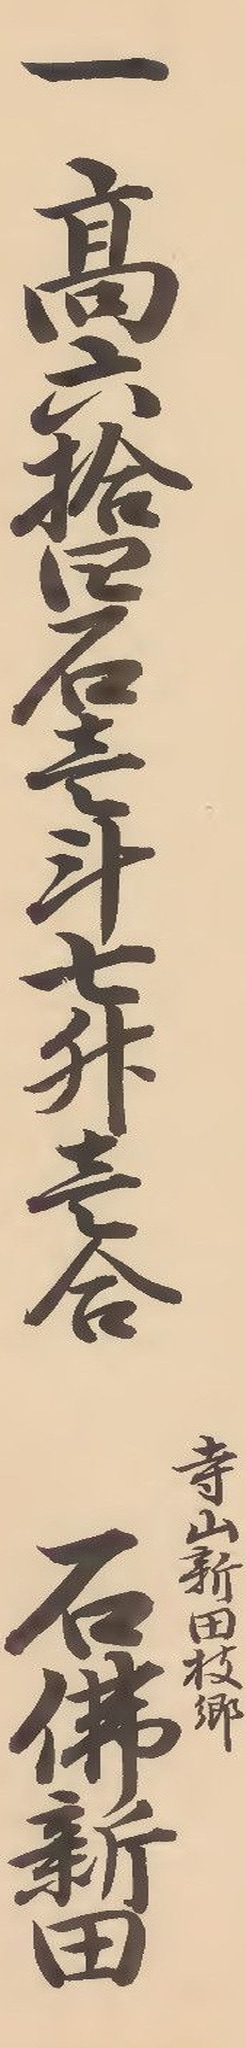一高六拾四石壱斗七升壱合石仏新田

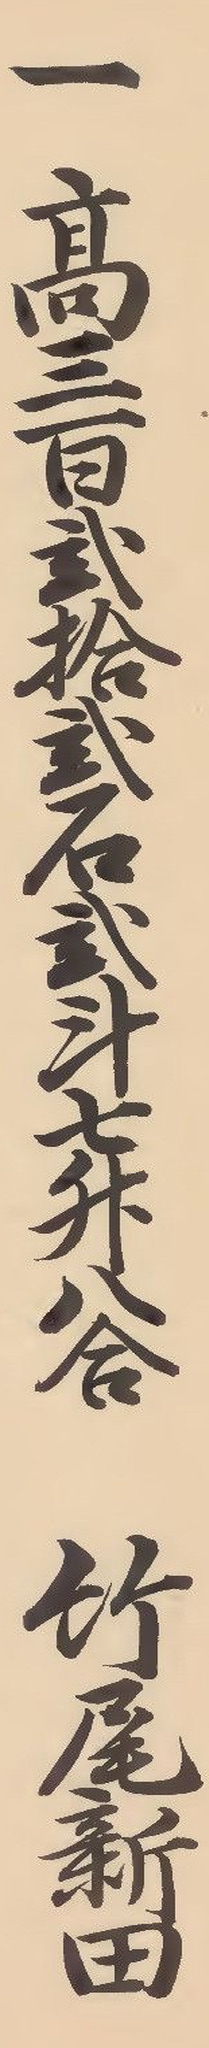一高三百弐拾弐石弐斗七升八合竹尾新田
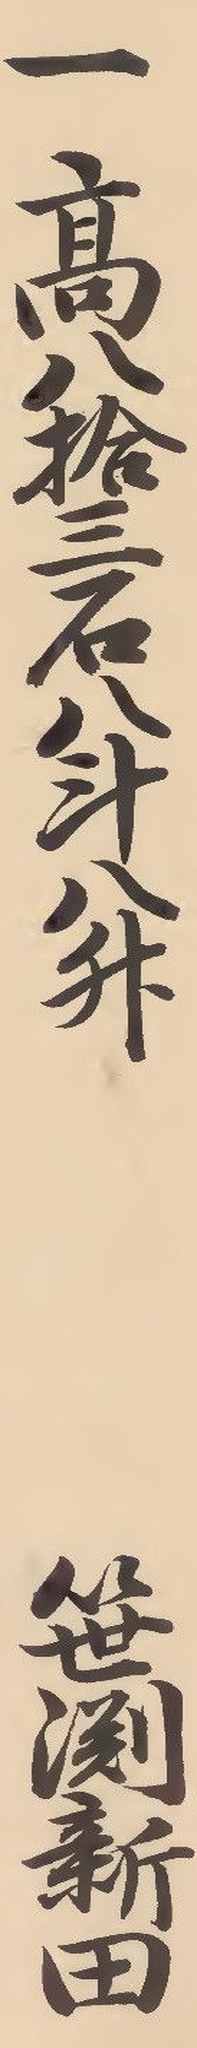一高八拾三石八斗八升笹淵新田
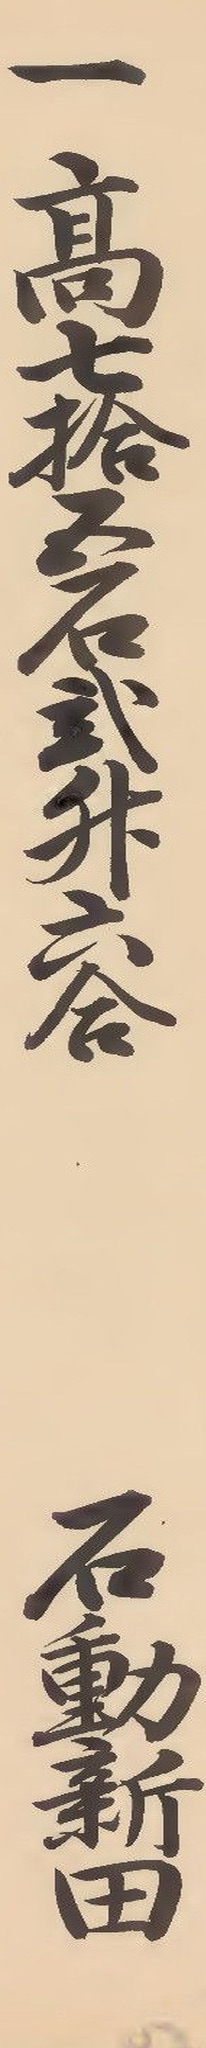一高七拾五石弐升六合石動新田
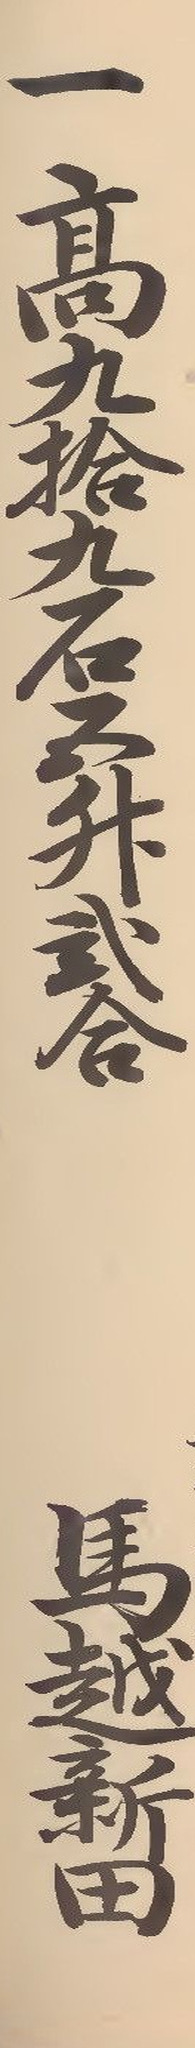一高九拾九石五升弐合馬越新田
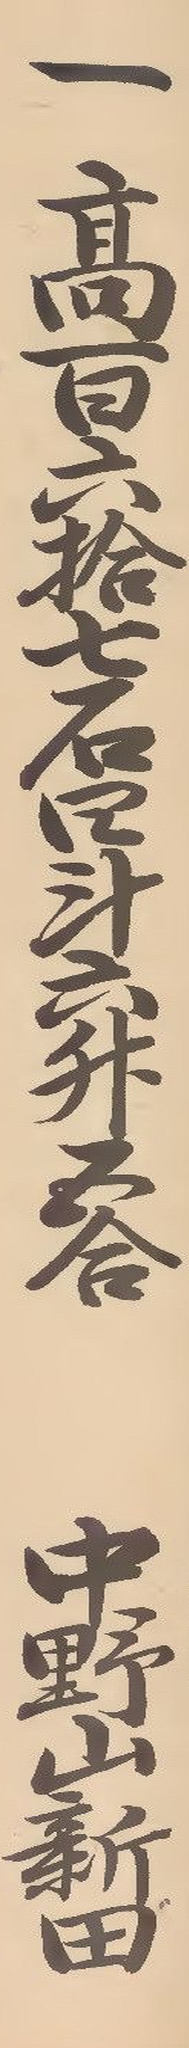一高百六拾七石四斗六升五合中野山新田
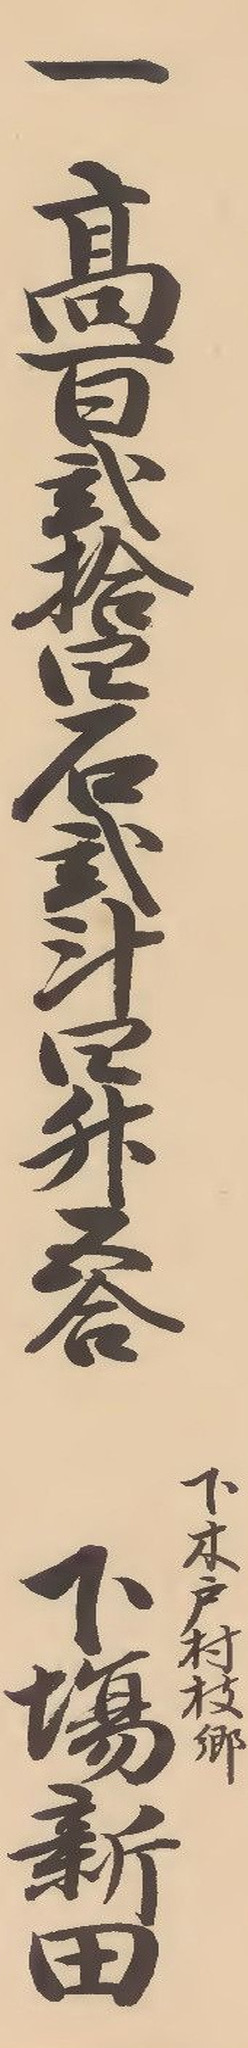一高百弐拾四石弐斗四升五合下場新田
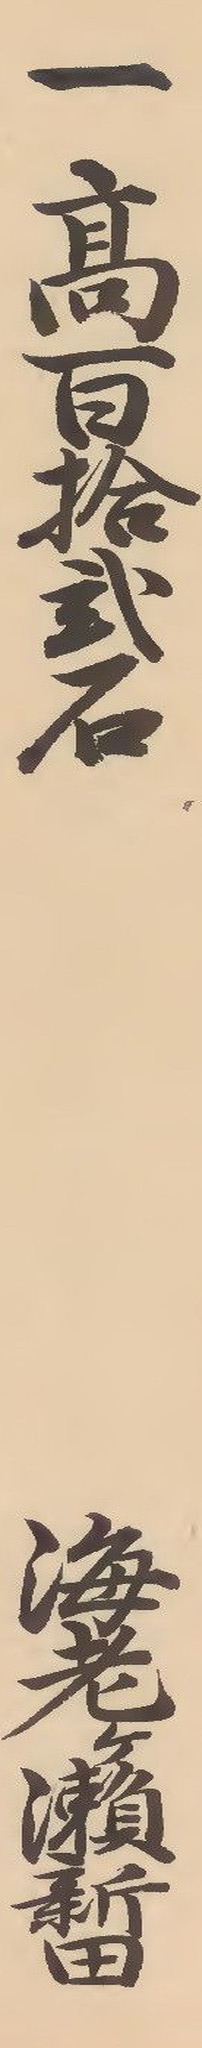一高百拾弐石海老ヶ瀬新田
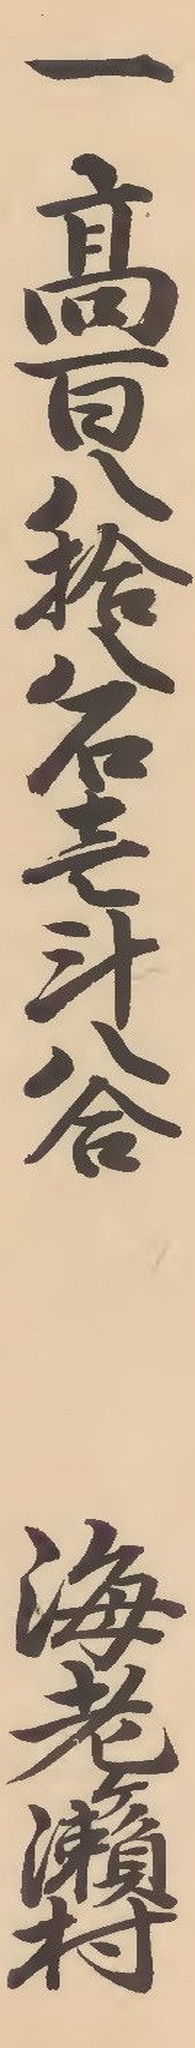一高百八拾八石壱斗八合海老ヶ瀬村

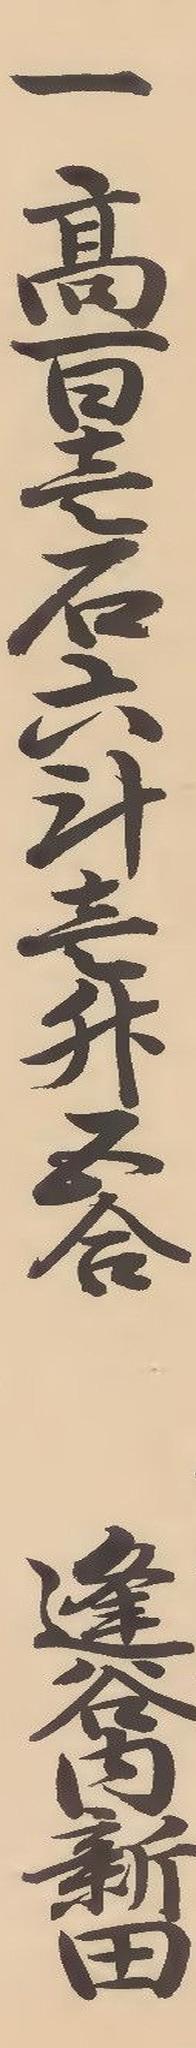一高百壱石六斗壱升五合逢谷内新田
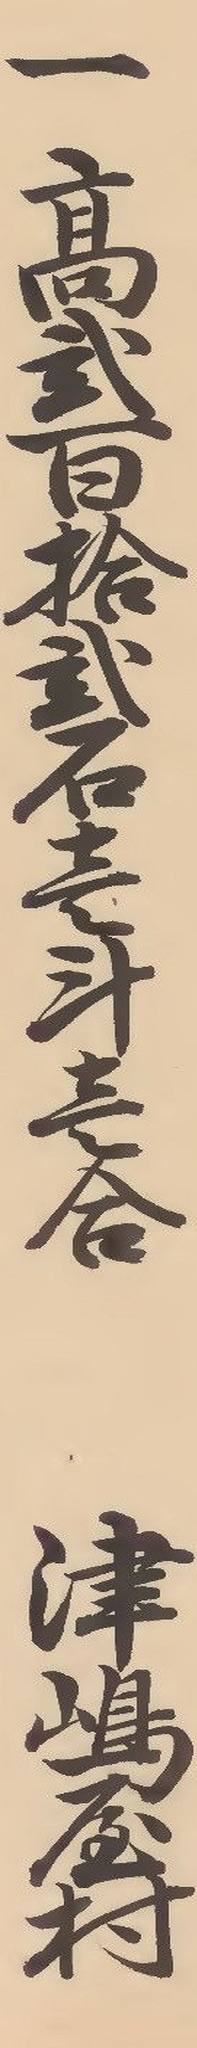一高弐百拾弐石壱斗壱合津島屋村
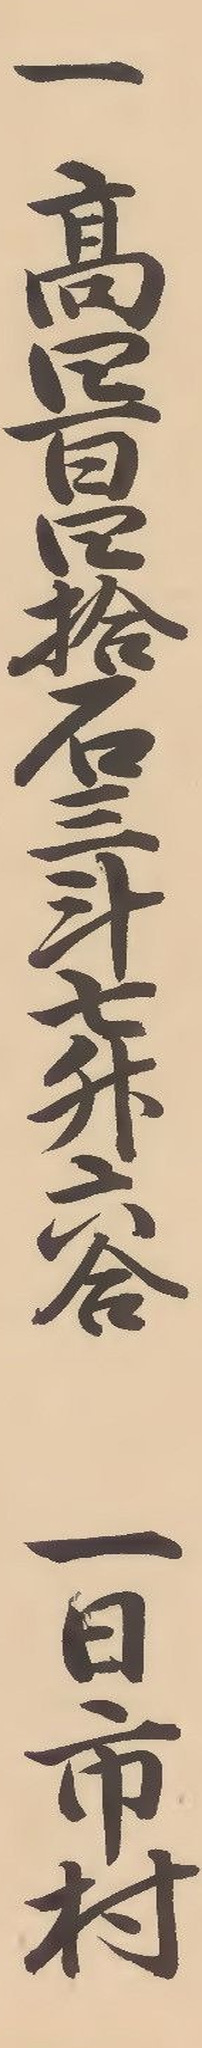一高四百四拾石三斗七升六合一日市村
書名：越後国郷帳　下
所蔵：国立公文書館 National Archives of Japan
